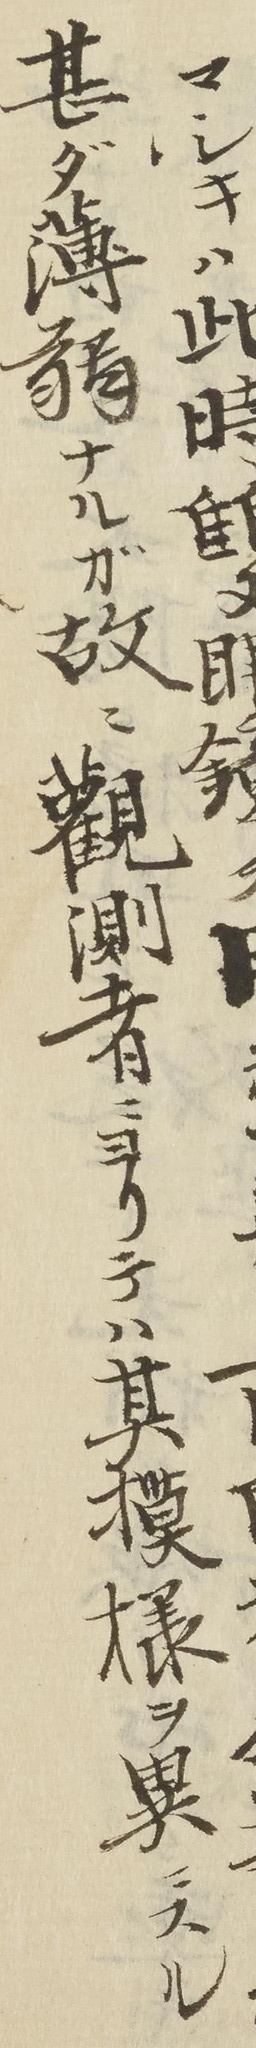甚ダ薄弱ナルガ故ニ観測者ニヨリテハ其模様ヲ異ニスル
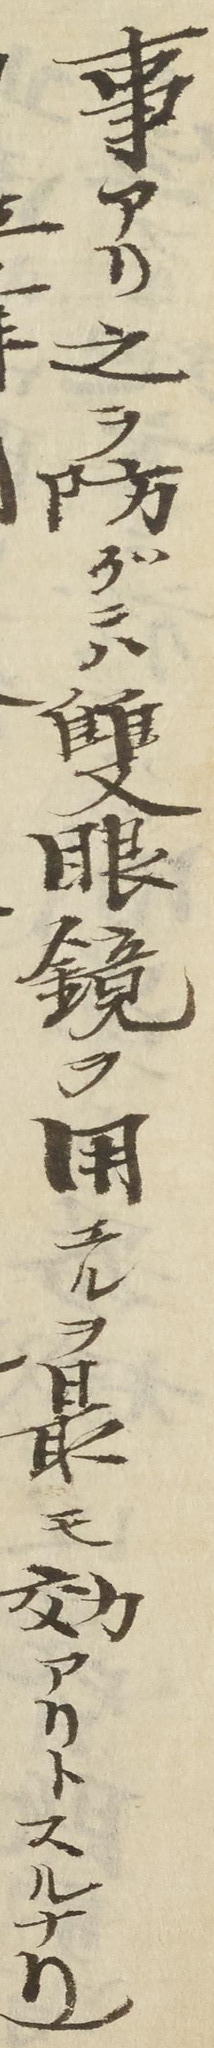事アリ之ヲ防グニハ双眼鏡ヲ用エルヲ最モ効アリトスルナリ）
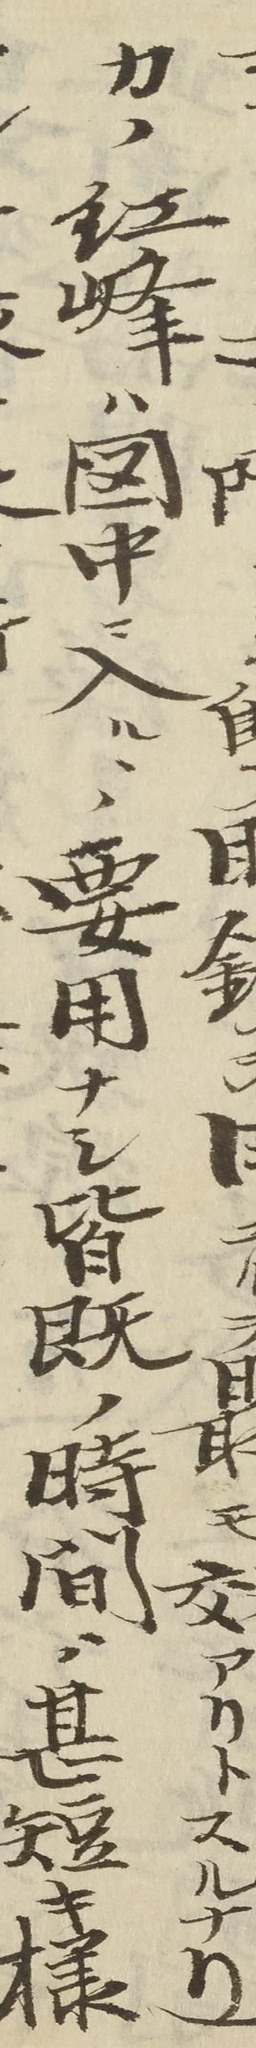カノ紅峰波図中ニ入ルゝノ要用ナシ皆既ノ時間ハ甚短キ様
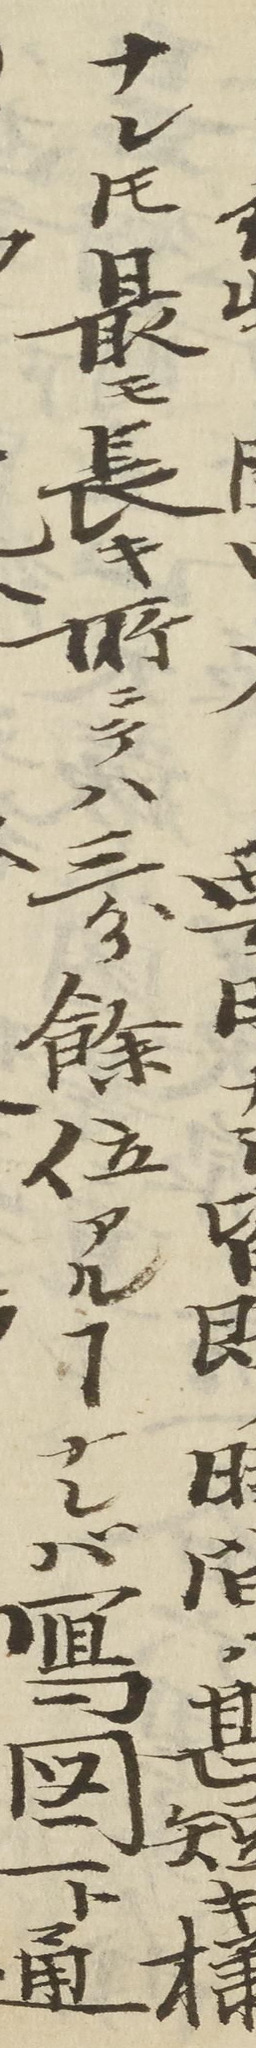ナレトモ最モ長キ所ニテハ三分余位アルコトナレバ写図一ト通
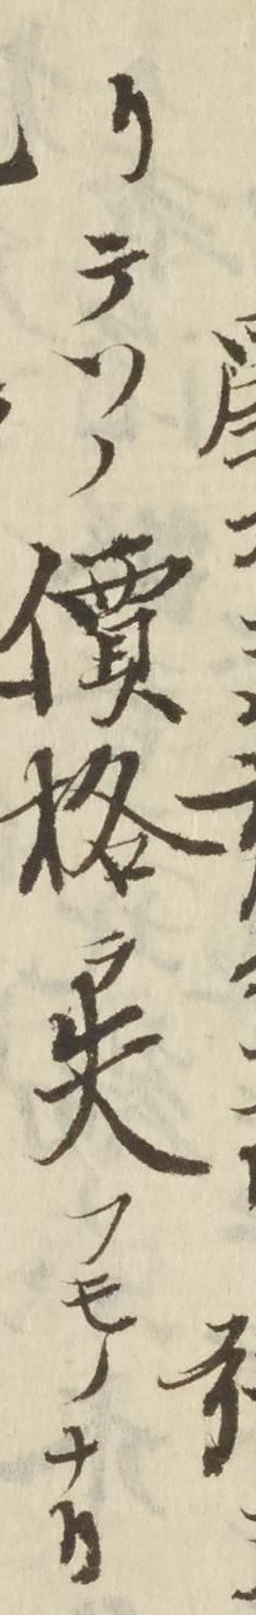リテソノ価格ヲ失フモノナリ
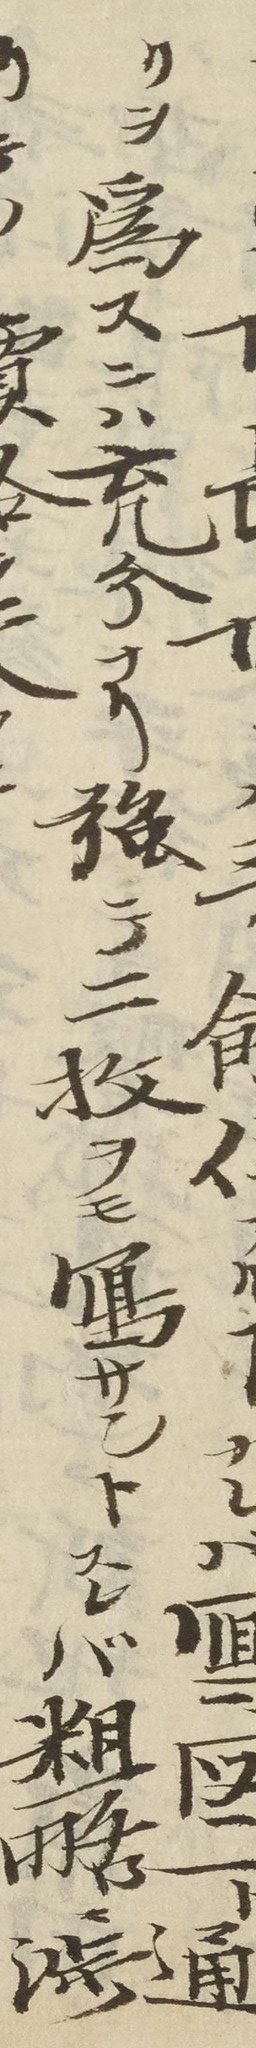リヲ為スニハ充分ナリ強テ二枚ヲモ写サントスレバ齟齬ニ渉
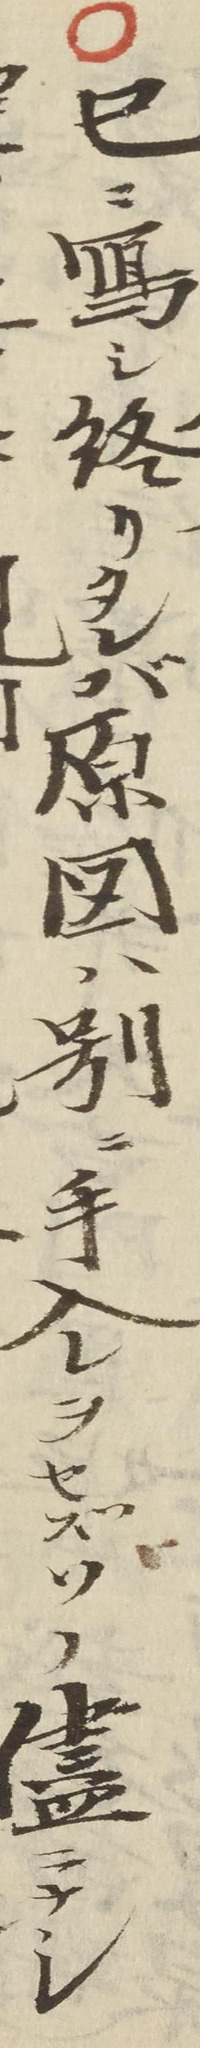○已ニ写シ終リタレバ原図ハ別ニ手入レヲセズソノ儘ニナシ
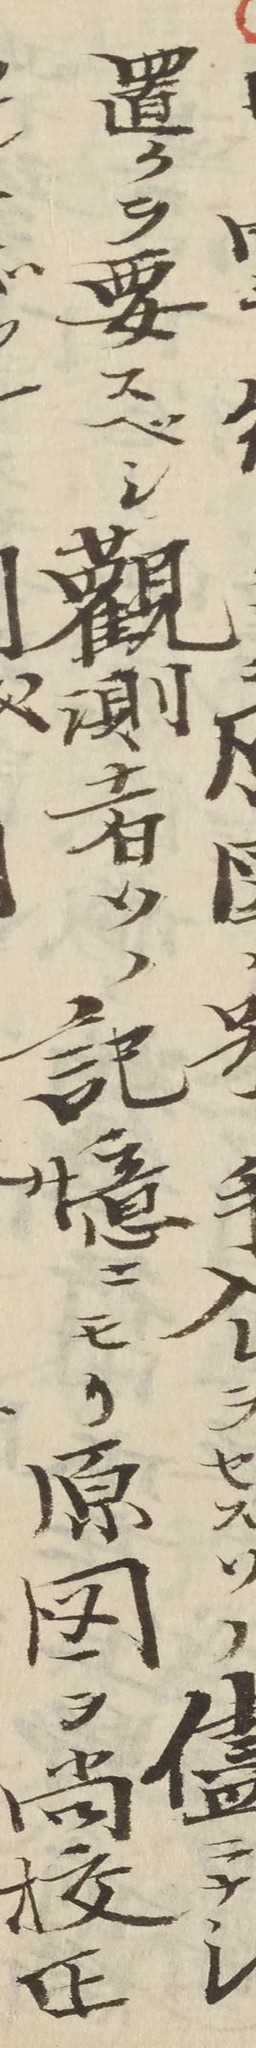置クヲ要スベシ観測者ソノ記憶ニモリ原図ヲ尚校正
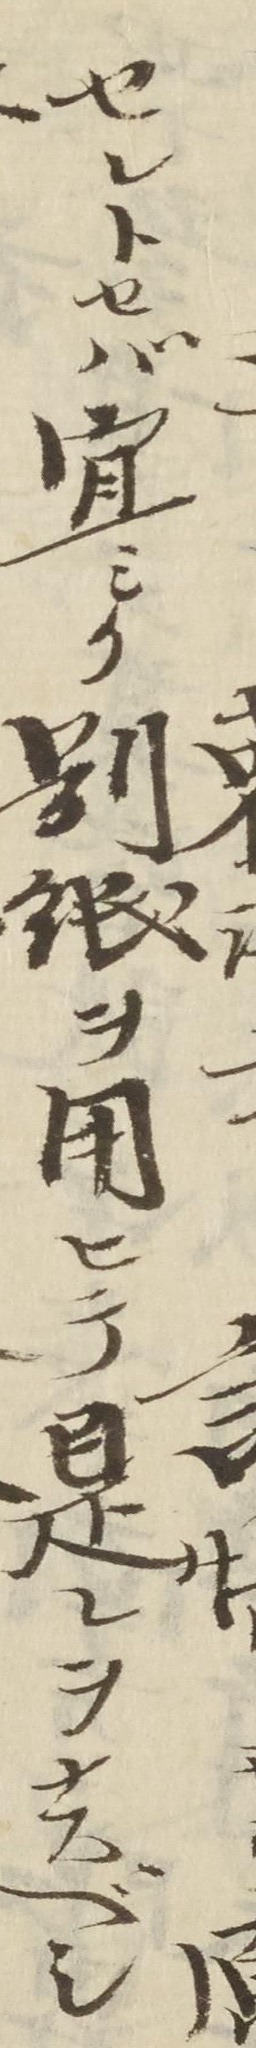セシトセバ宜シク別紙ヲ用ヒテ是ヲナスベシ
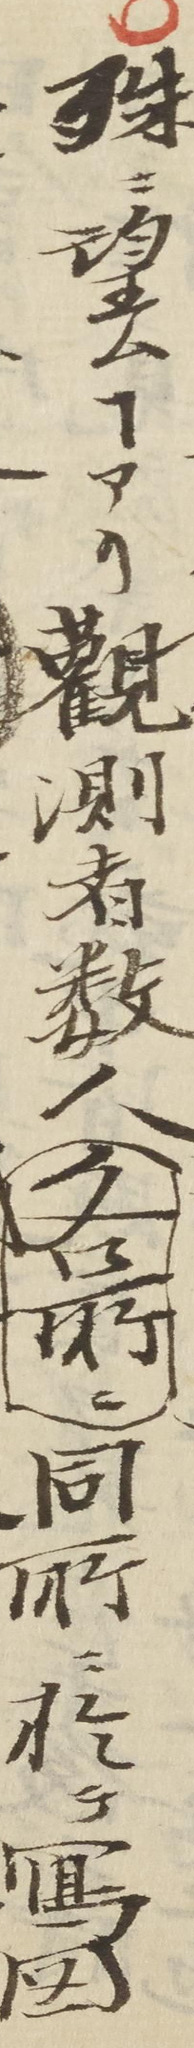○殊ニ望ムコトアリ観測者数人同所ニ於テ写図
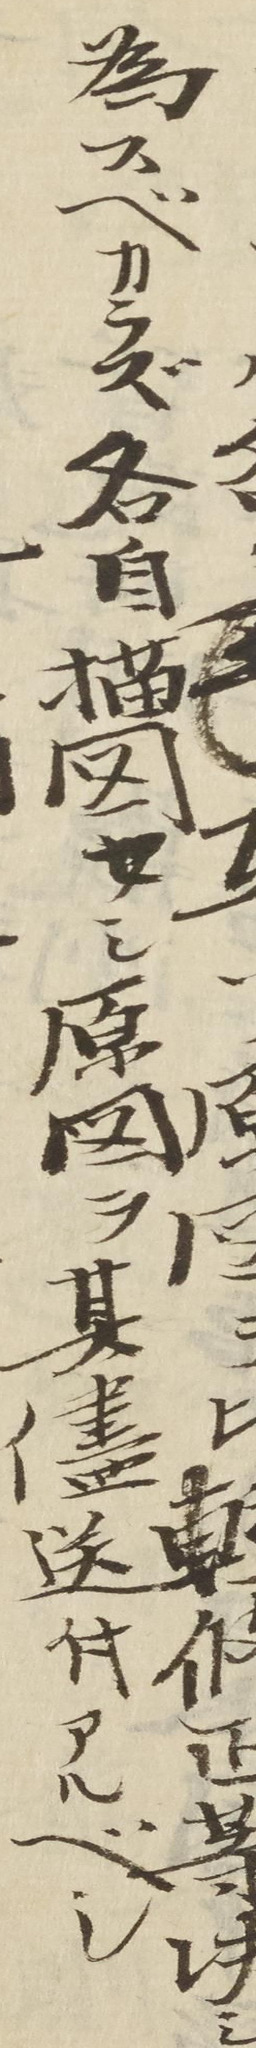為スベカラズ各自描画セシ原図ヲ其儘送付アルベシ
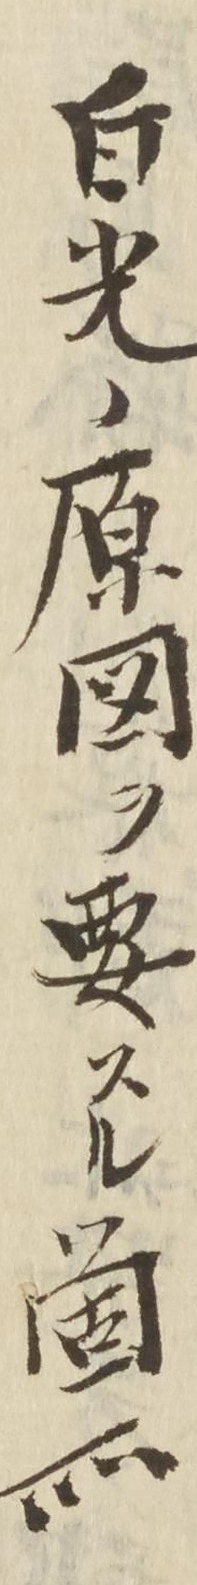白光ノ原図ヲ要スル箇所

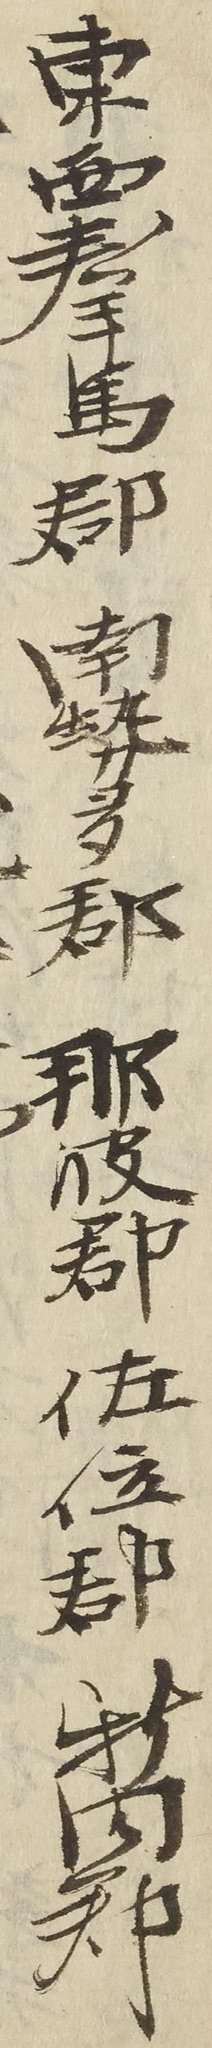東西群馬郡南勢多郡那波郡佐位郡新田郡
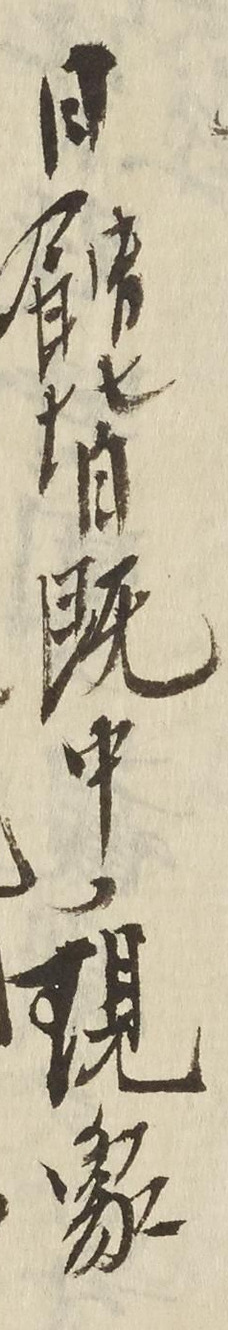日蝕皆既中ノ現象
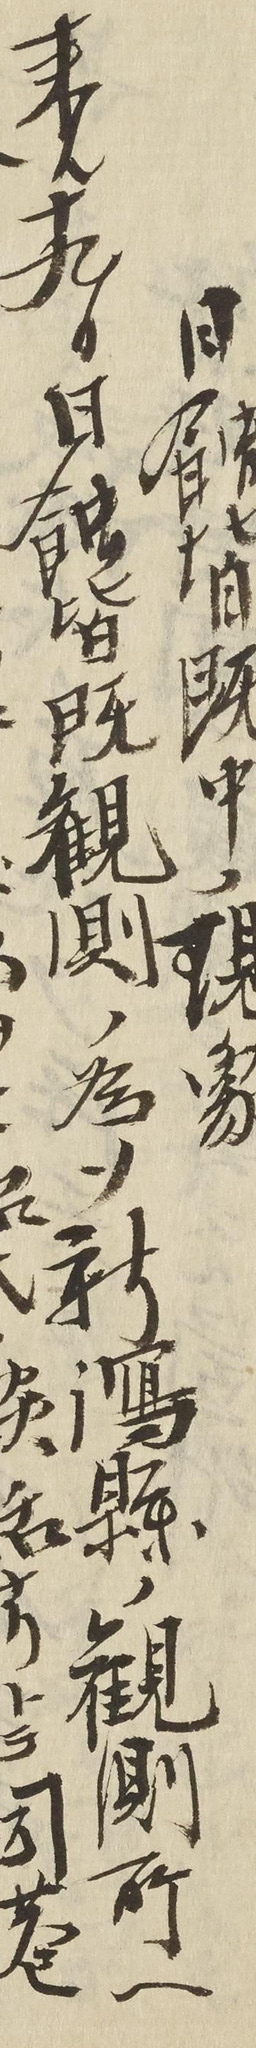来ル十九日日蝕皆既観測ノ為メ新潟県ノ観測所へ
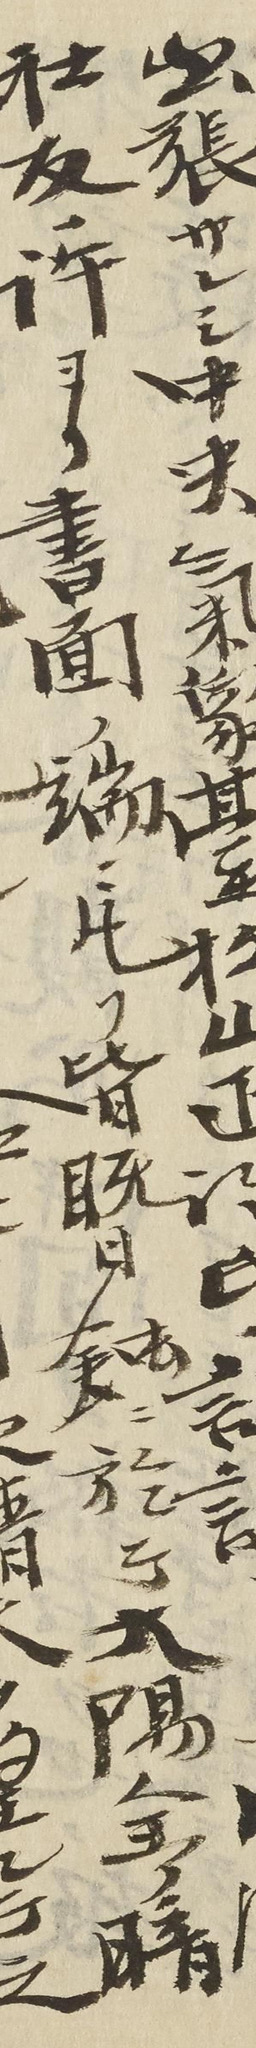社友ノ許ヨリ書面ノ端二凡ソ皆既日蝕ニ於テ大陽全ク暗
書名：日蝕録　全
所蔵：東京大学地震研究所図書室 Earthquake Research Institute Library, The University of Tokyo, JAPAN
